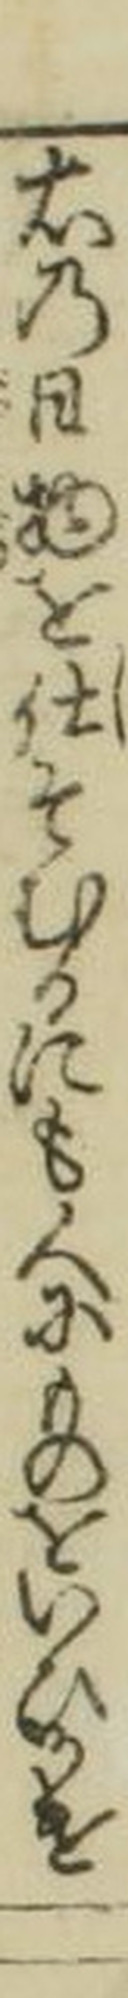右の日物を仕そむるにも人にものをいひかけ
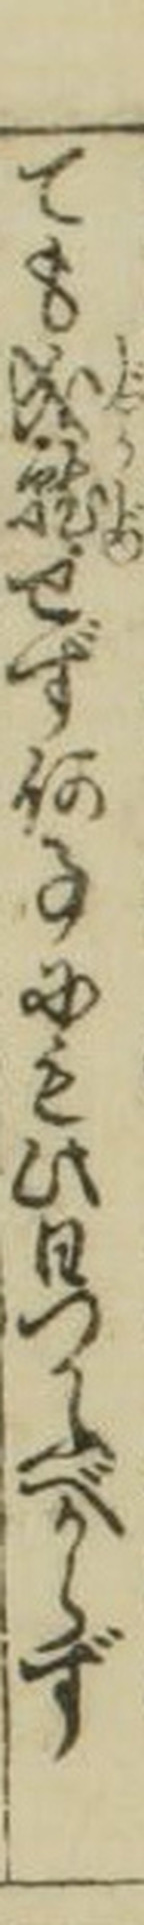ても成就せず何事にも此日つかふべからず
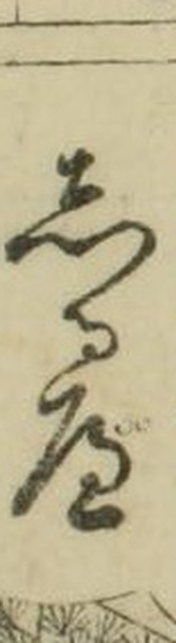しるべ
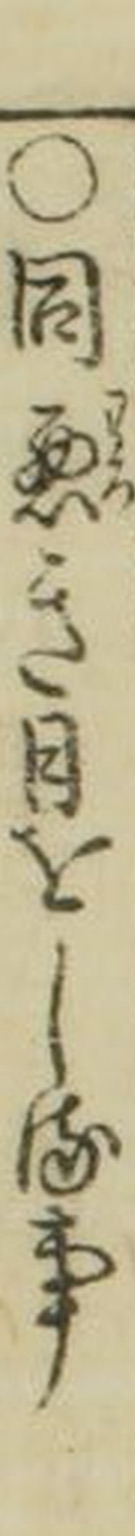◯同悪き日をしる事
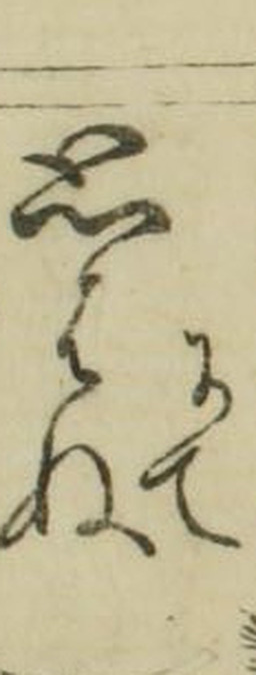思はぬ
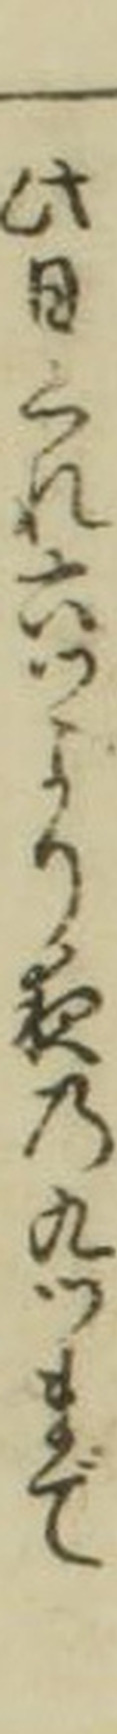此日くれ六ツより夜の九ツまで
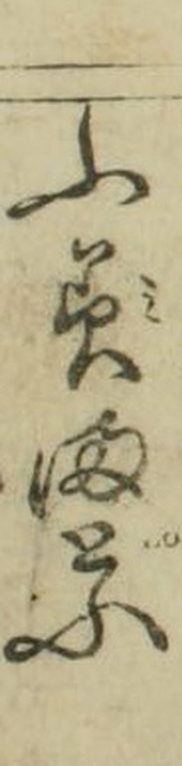ふみまどふ
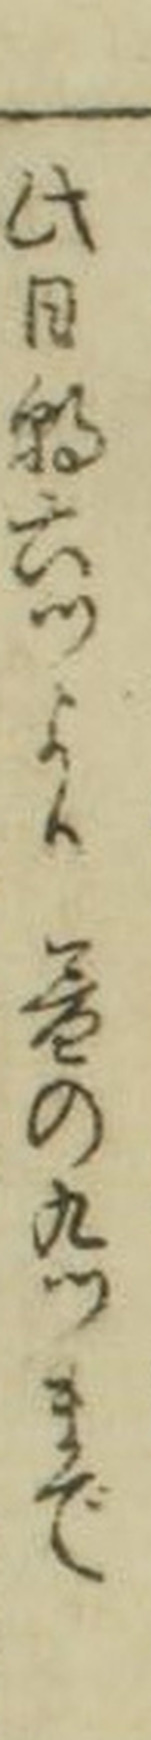此日朝六ツより暮の九ツまで
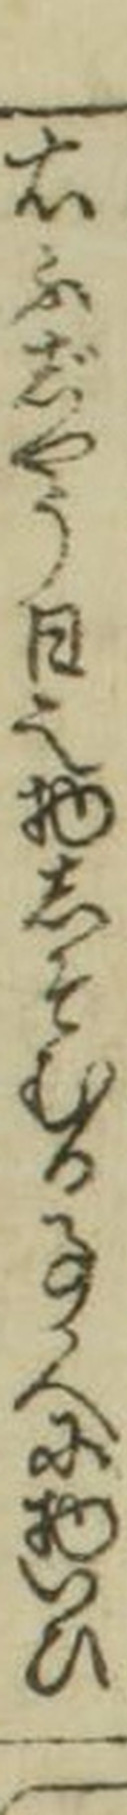右ふじやう日也物しそむる事人に物いひ
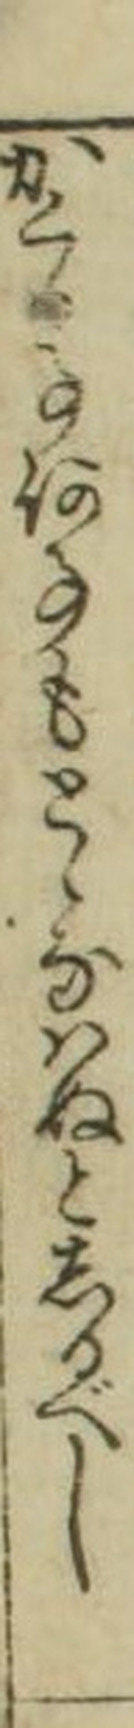かくる事何事もとゝなはぬとしるべし

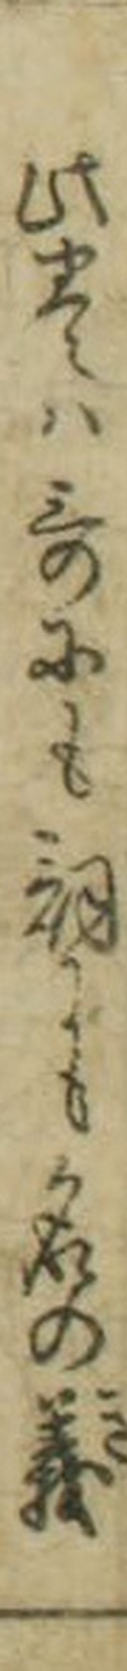此巻は哥にも詞にも名の義
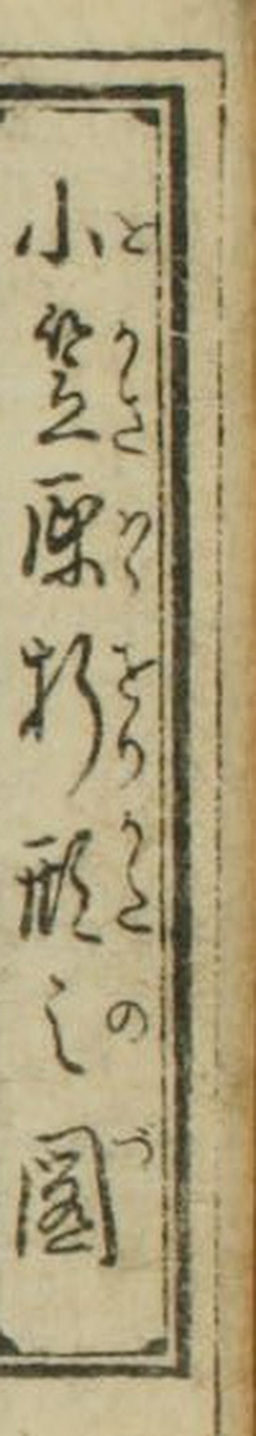小笠原折形之図
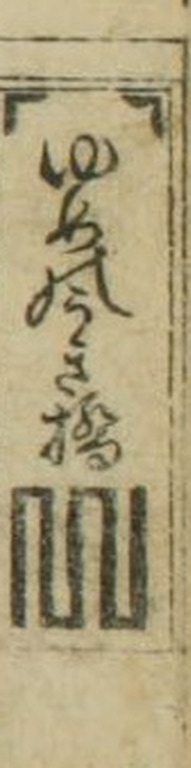ゆめのうき橋
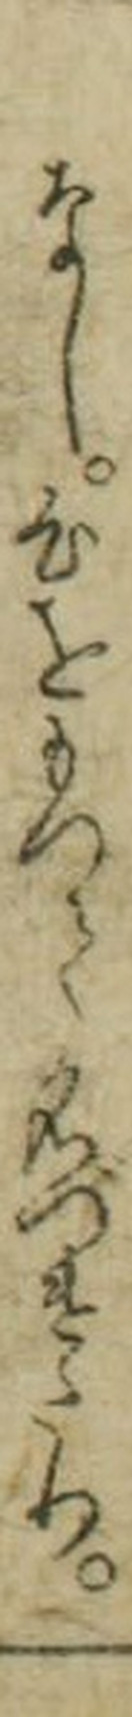なし。心をもつて名づけたり。
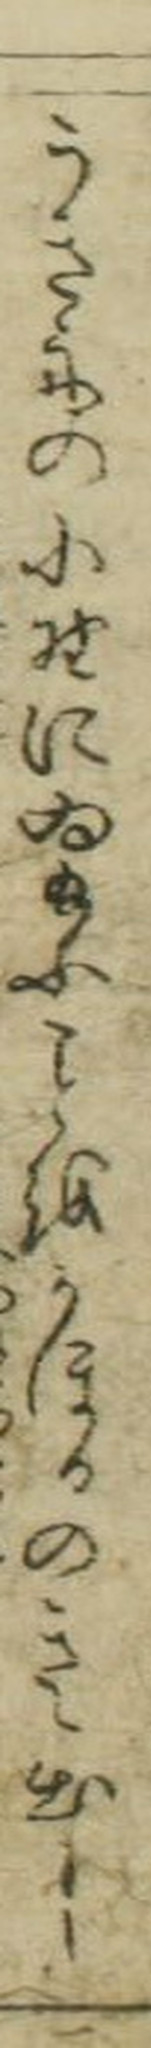うき舟の小野に居給ふことをかほるのきゝ出し
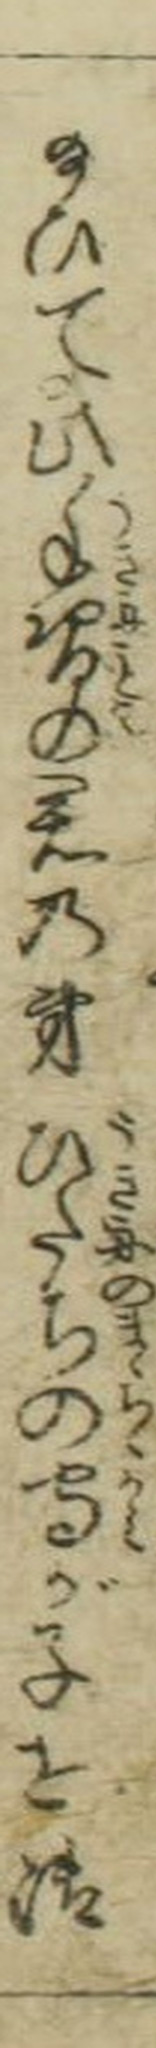給ひて◯此手習の君の弟ひたちの守が子を御
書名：女源氏教訓鑑
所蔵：東京学芸大学附属図書館
